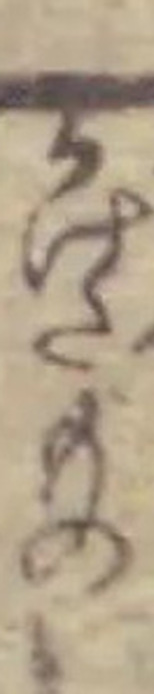かけたもの
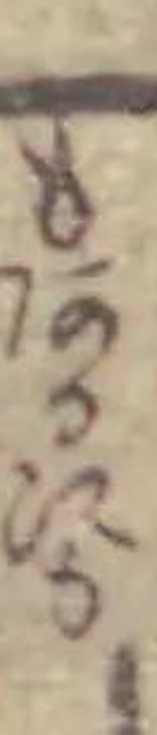もあるにも
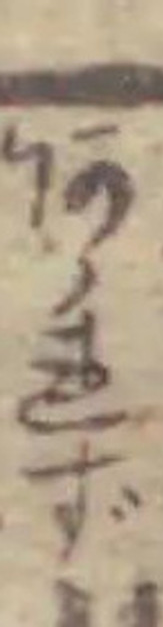あられず
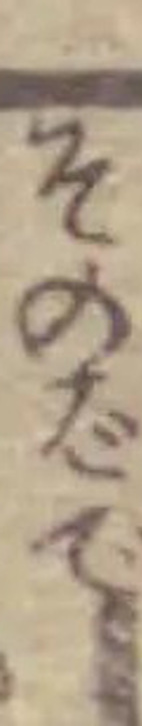そのばで
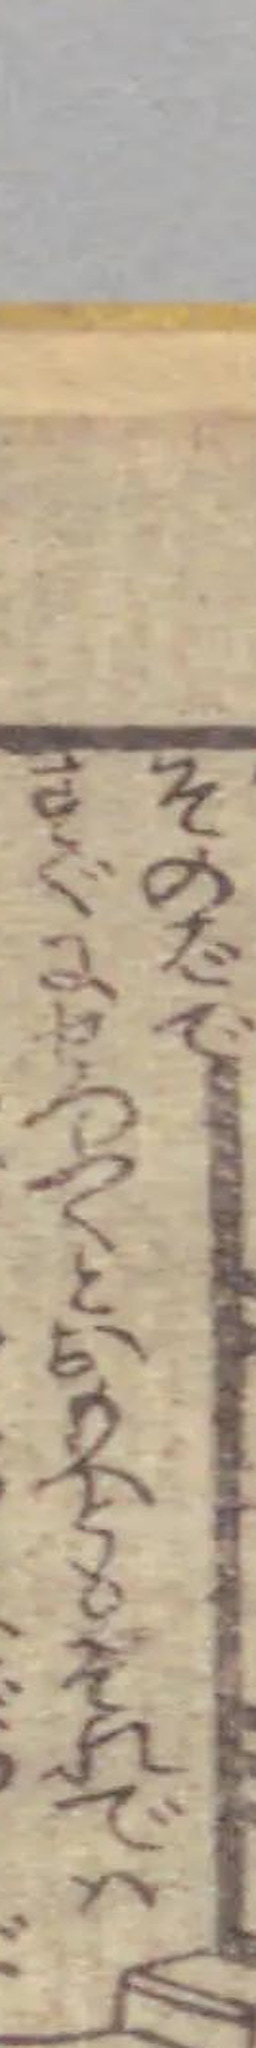すぐにせつふくとおもへともそれでは
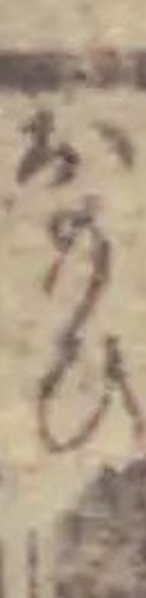おもひ
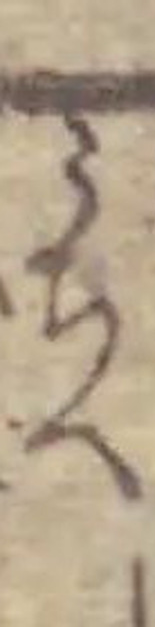うちへ
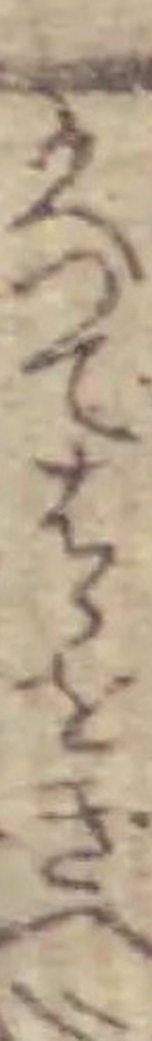かへつてはらをき
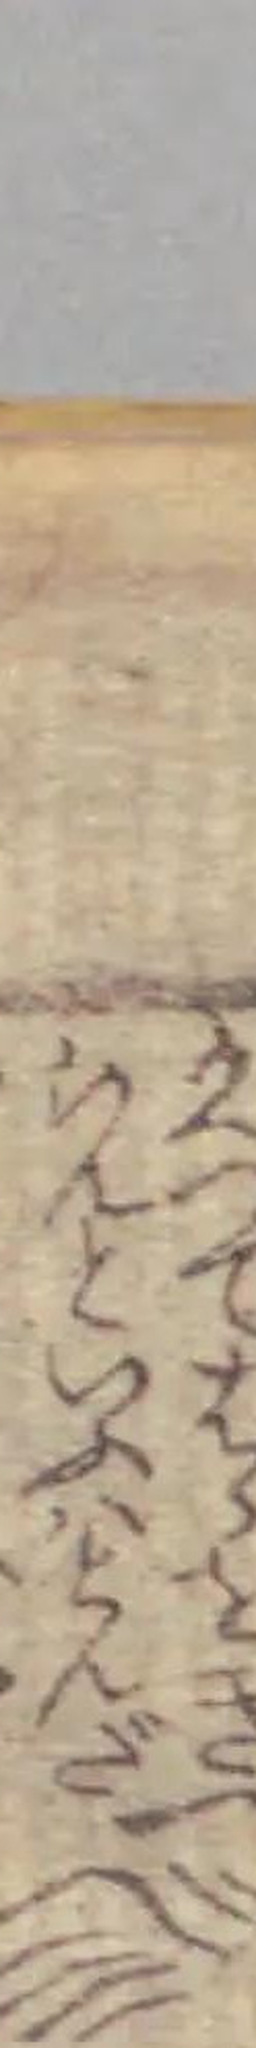らんといふはとんだ
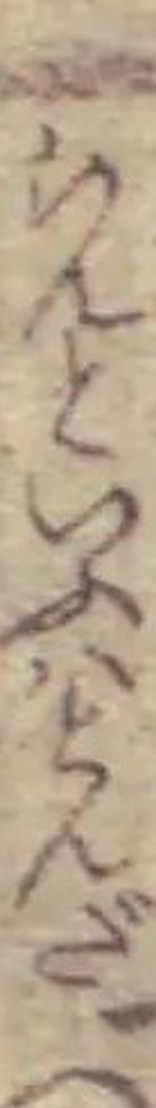らんといふはとんだ
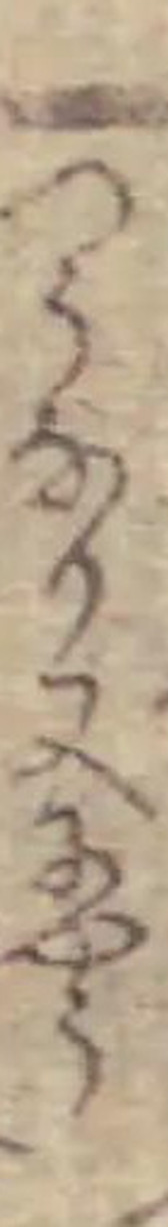つうなり又にやう
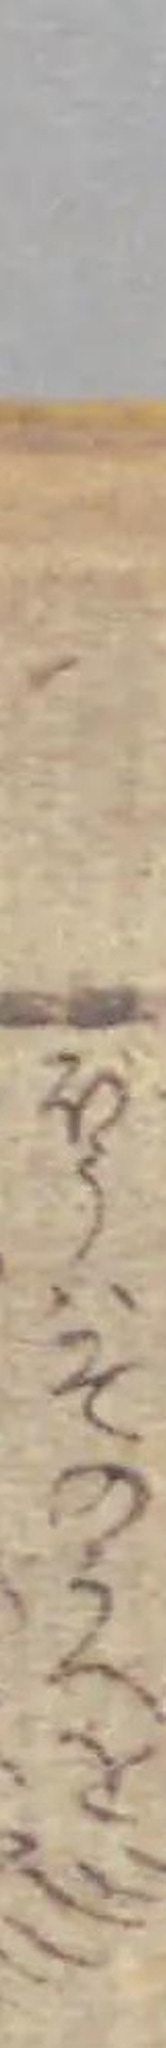ぼうはそのうへを
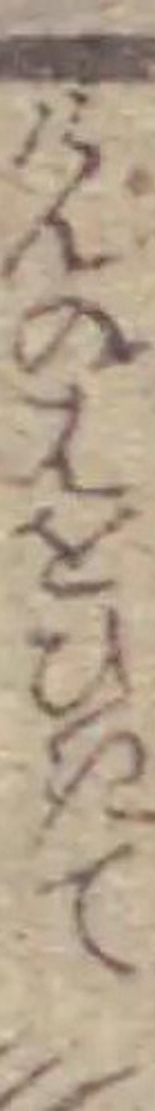けんのはをひきて
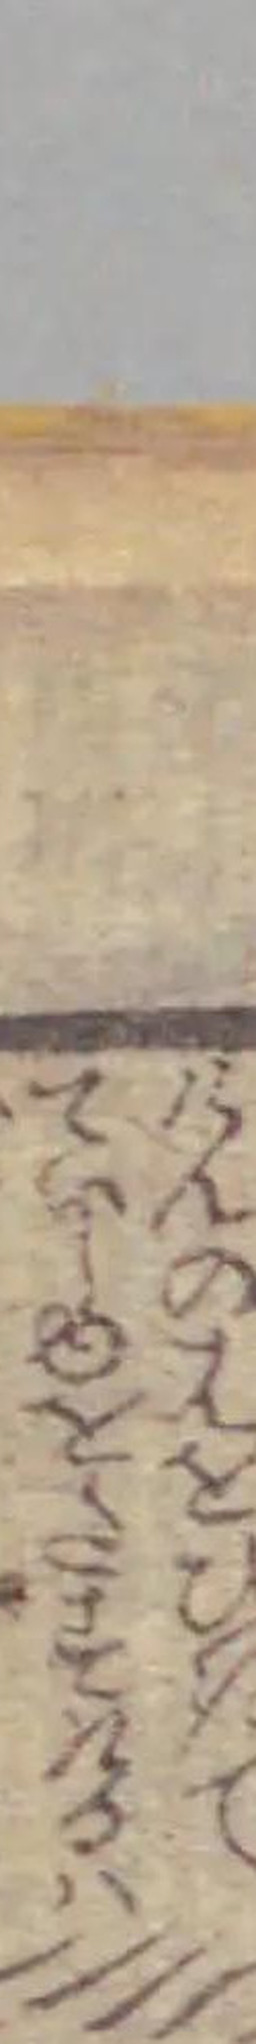ていしゆをたすけるは
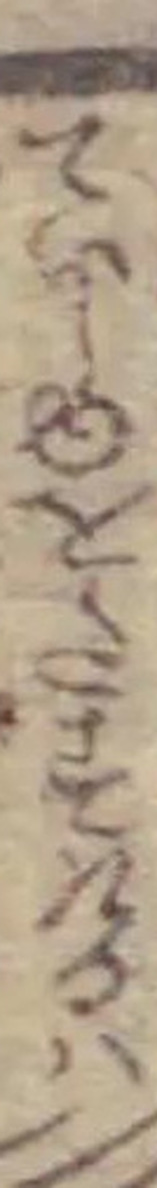ていしゆをたすけるは
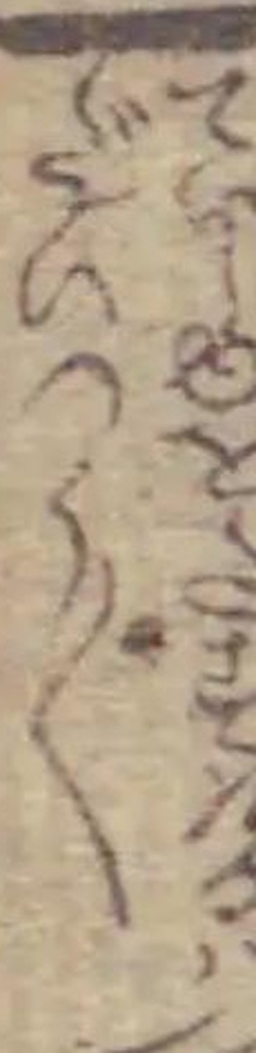だいつう〳〵
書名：茶羅毛通人 3巻
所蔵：国立国会図書館 National Diet Library, JAPAN
